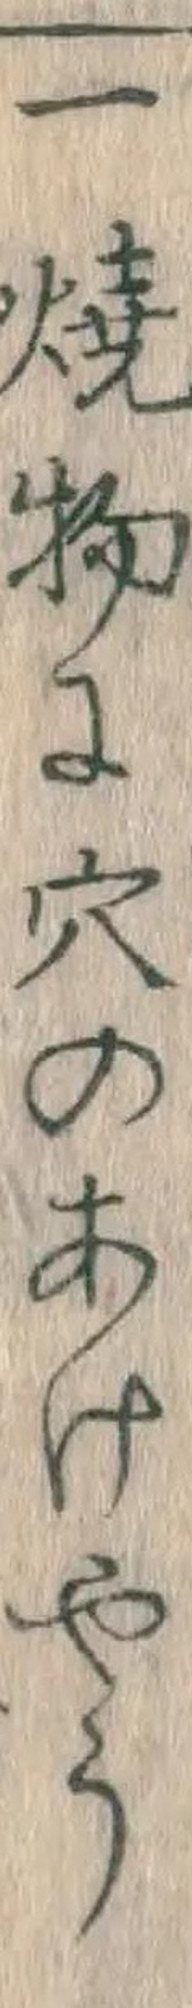一焼物に穴のあけやう
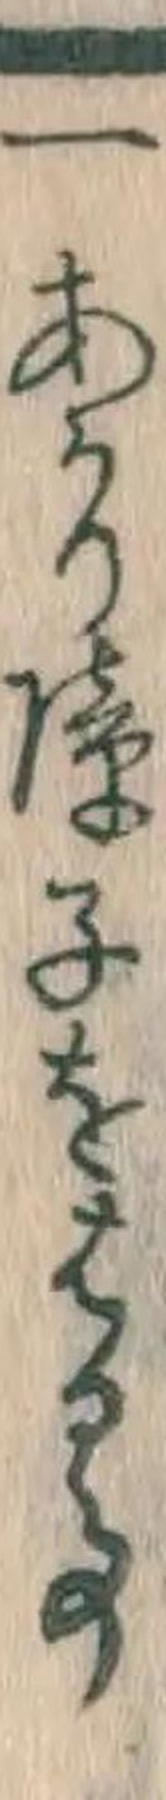一あかり障子をはる事
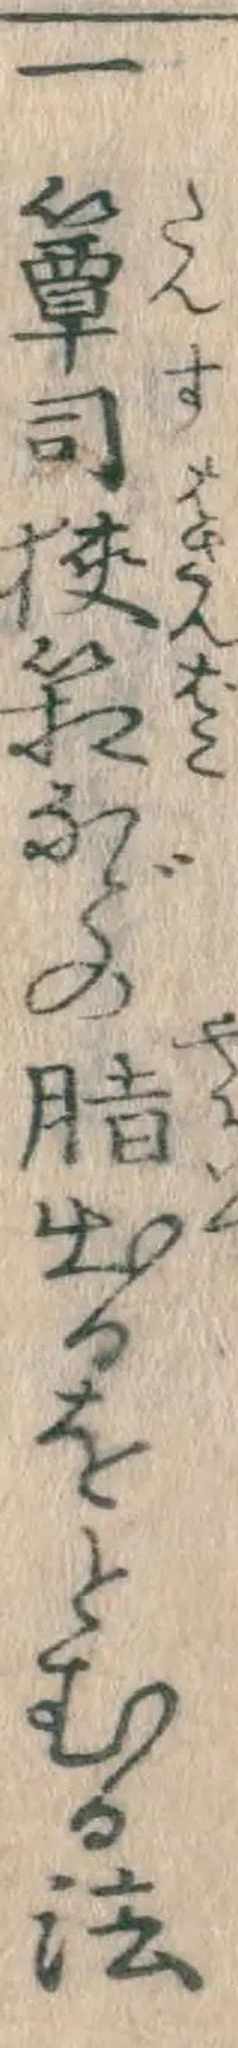一箪笥挟箱などの脂出るをとむる法
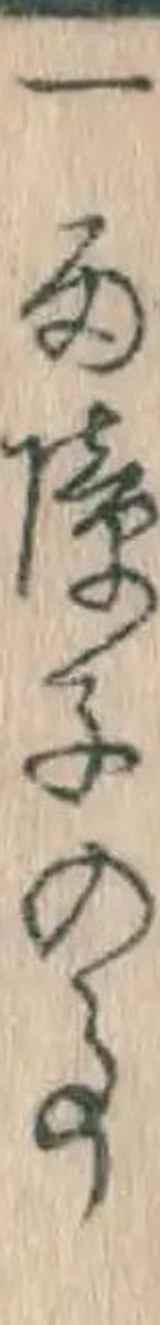一雨障子の事
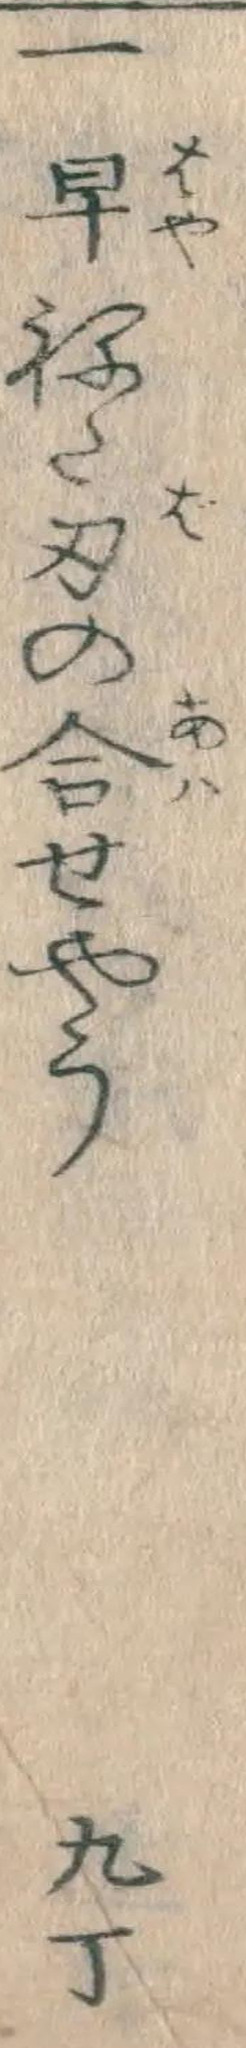一早ねた刃の合せやう九丁
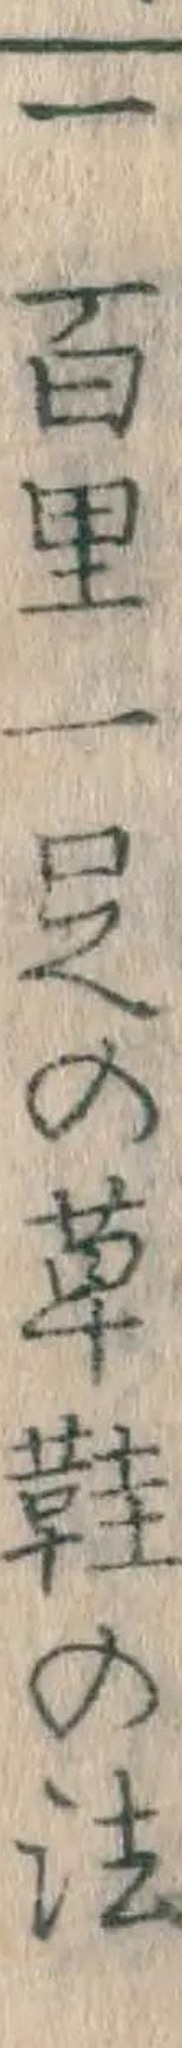一百里一足の草鞋の法
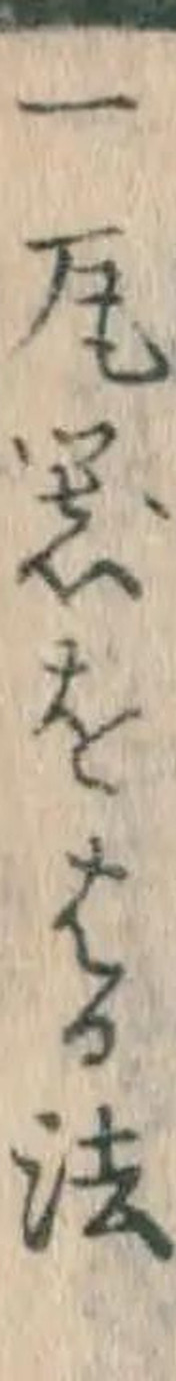一瓦器をはる法
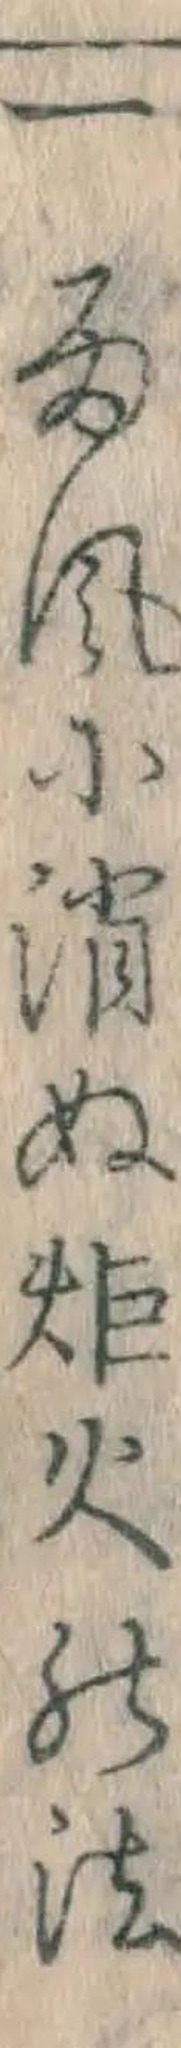一雨風に消ぬ炬火の法
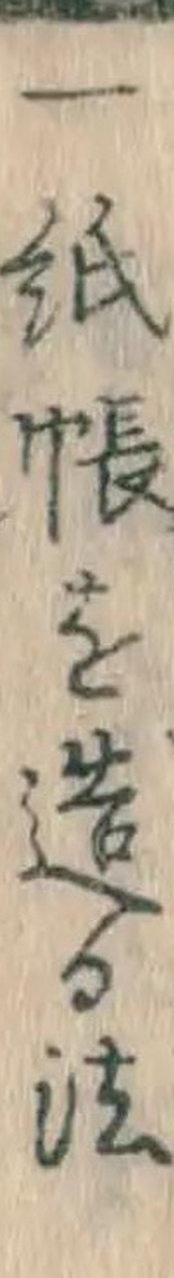一紙帳を造る法
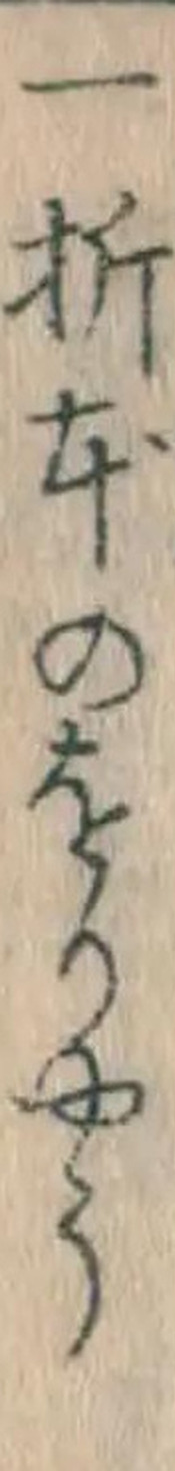一折本のをりやう

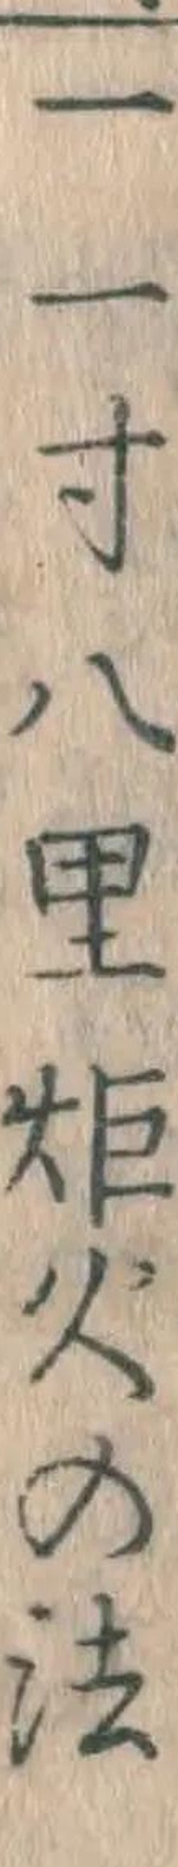一一寸八里炬火の法
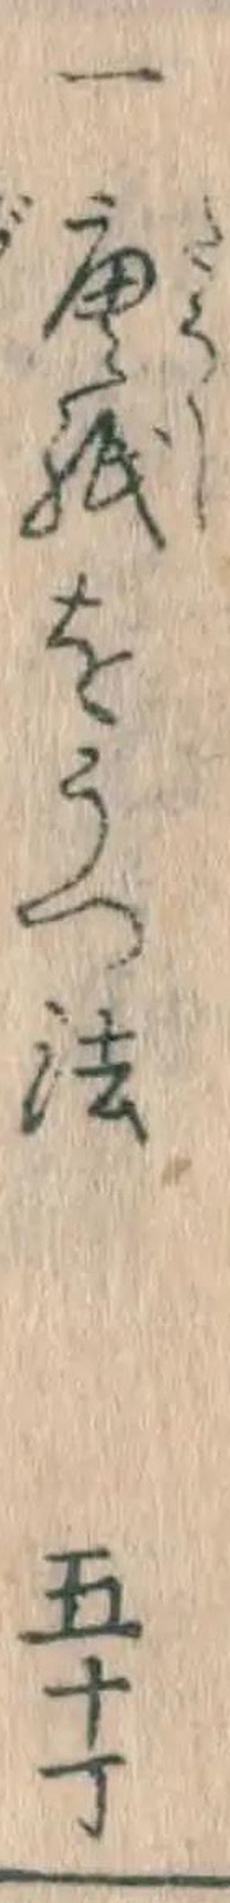一唐紙をうつ法五十丁
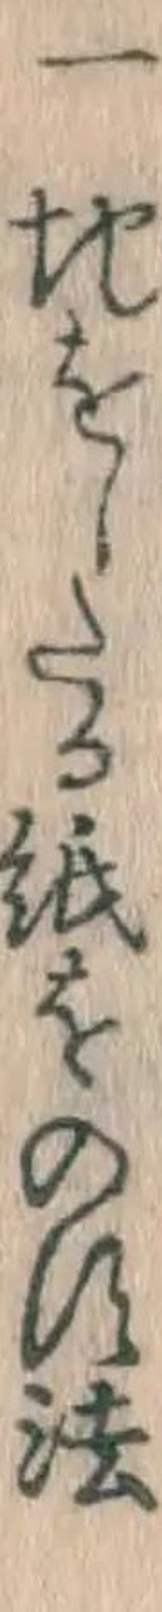一地をしたる紙をのす法
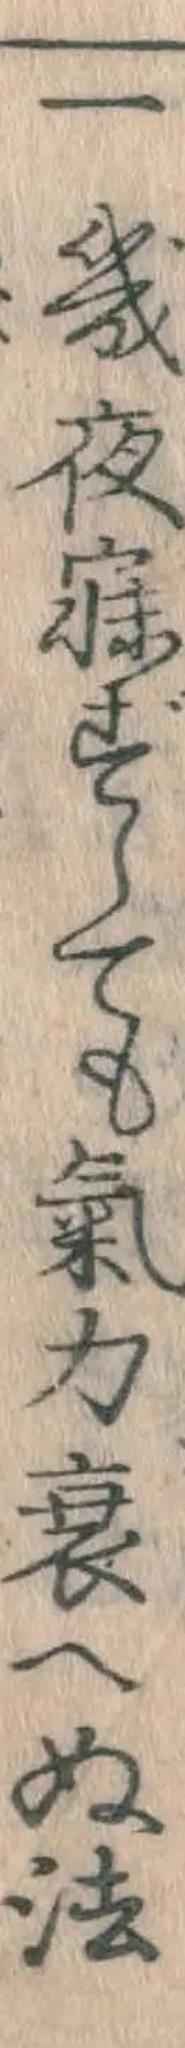一幾夜寝ずしても気力衰へぬ法
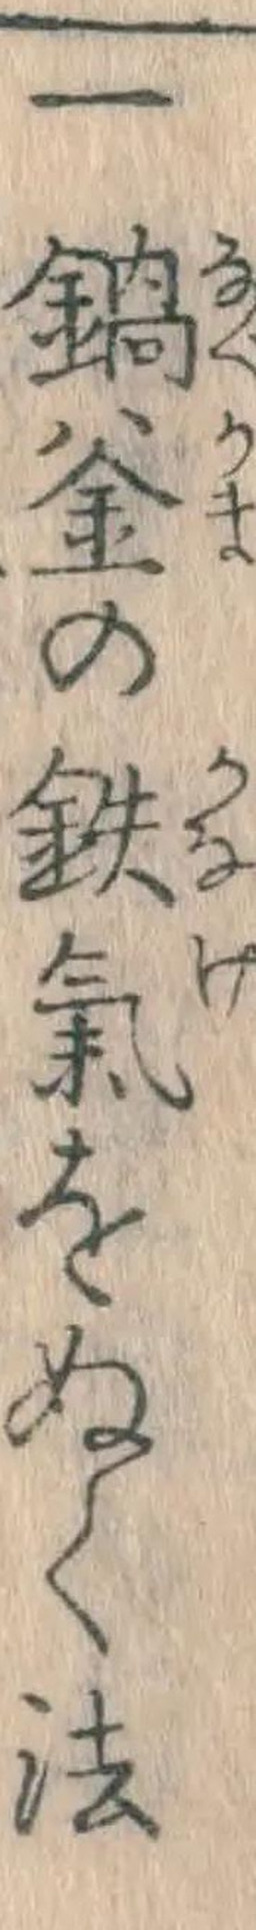一鍋釜の鉄気をぬく法
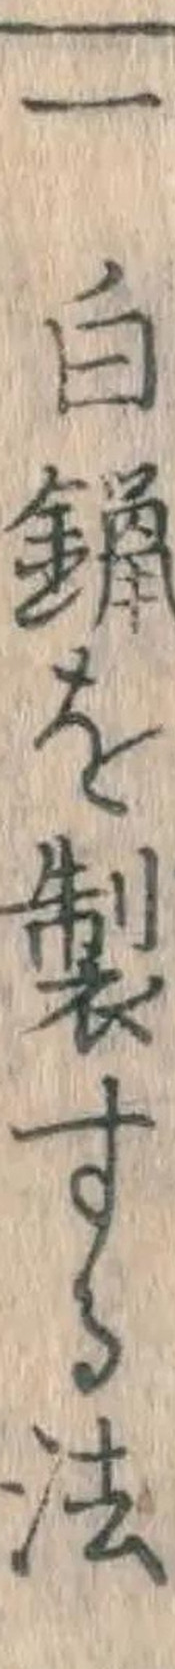一白鑞を製する法
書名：広益秘事大全 3巻. [1]
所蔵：国立国会図書館 National Diet Library, JAPAN
